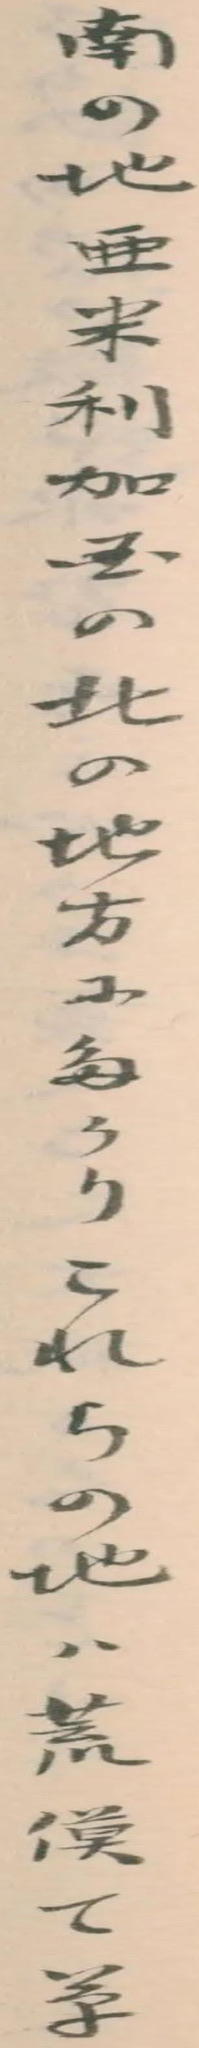南の地亜米利加国の北の地方に多かりこれらの地は荒漠て草
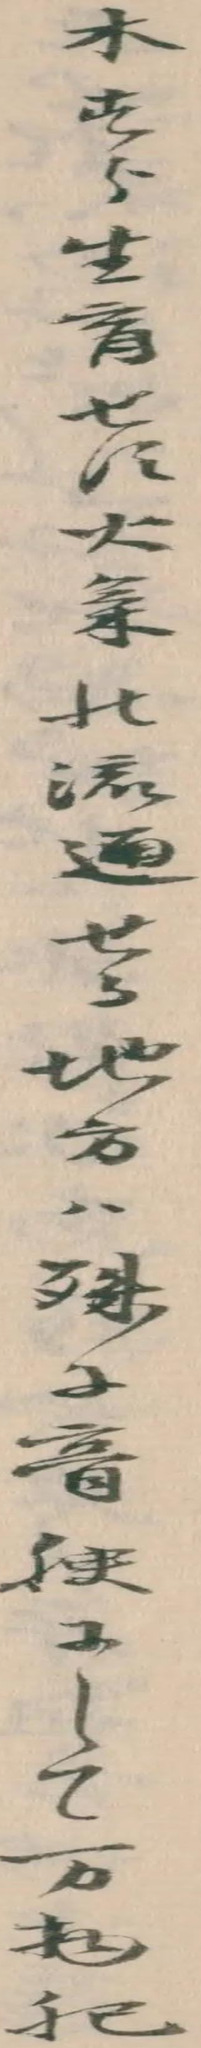木すら生育せす火気の流通せる地方は殊に膏腴にして万物肥
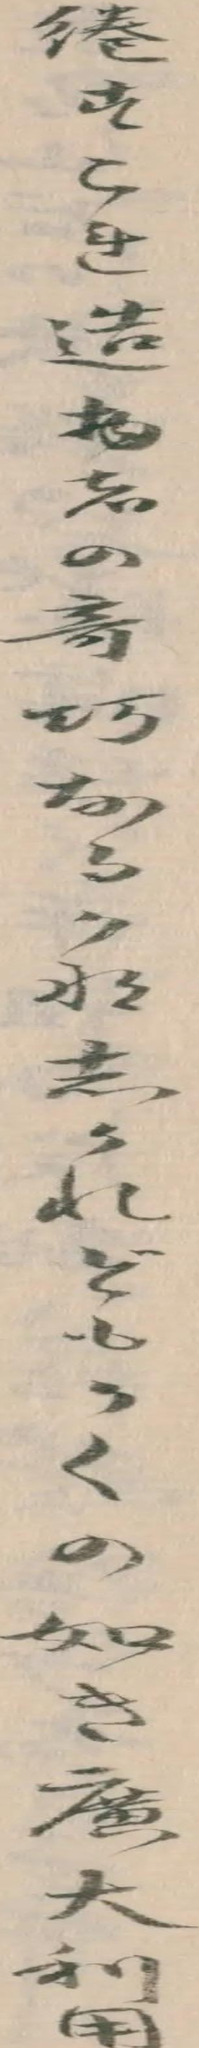綣すこれ造物者の奇巧なるかなしかれどもかくの如き広大利用
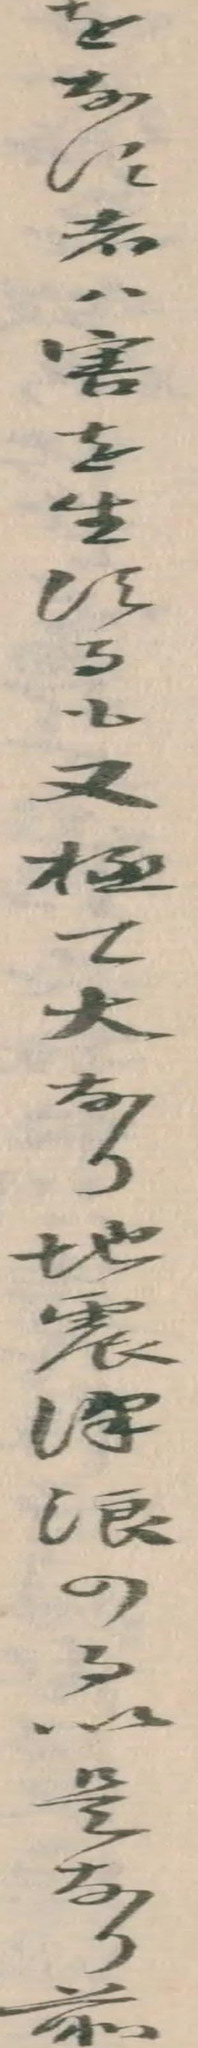をなす者は害を生するも又極て大なり地震津浪のるい是なり前
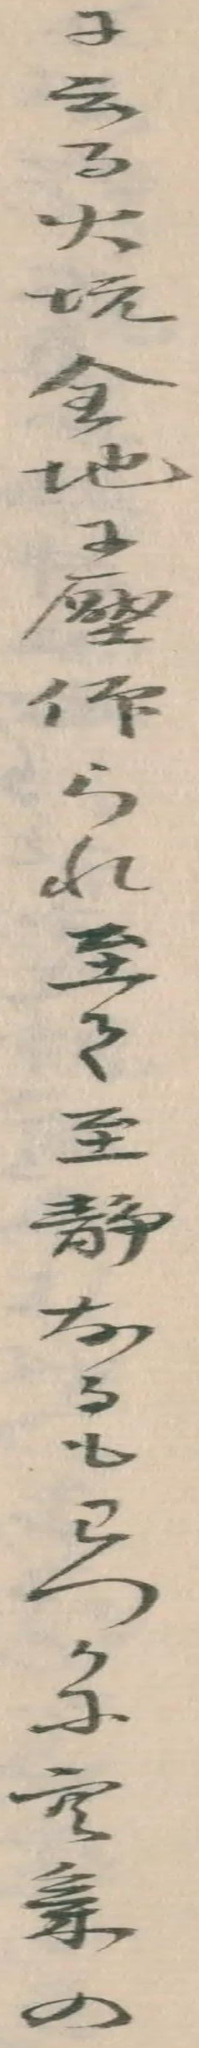に云る火坑全地に圧仰られ至て至静なるもわつかに空気の
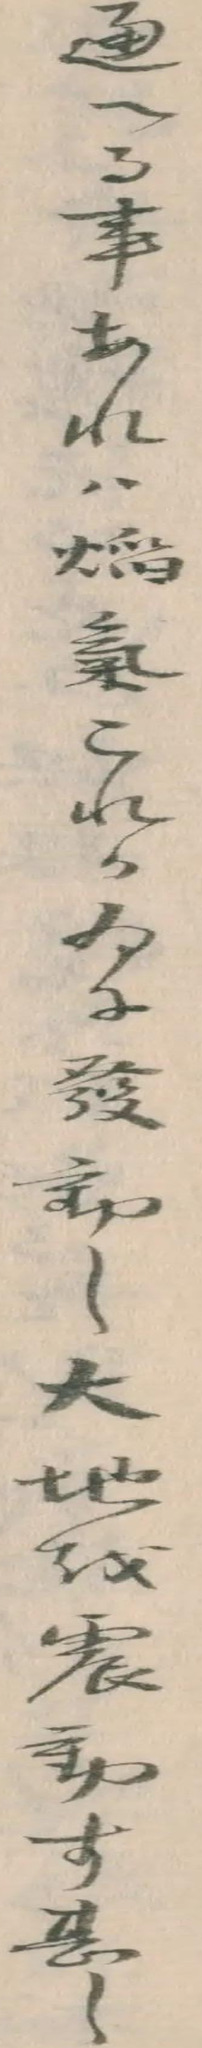通へる事あれは焔気これか為に発動し大地を震動す甚
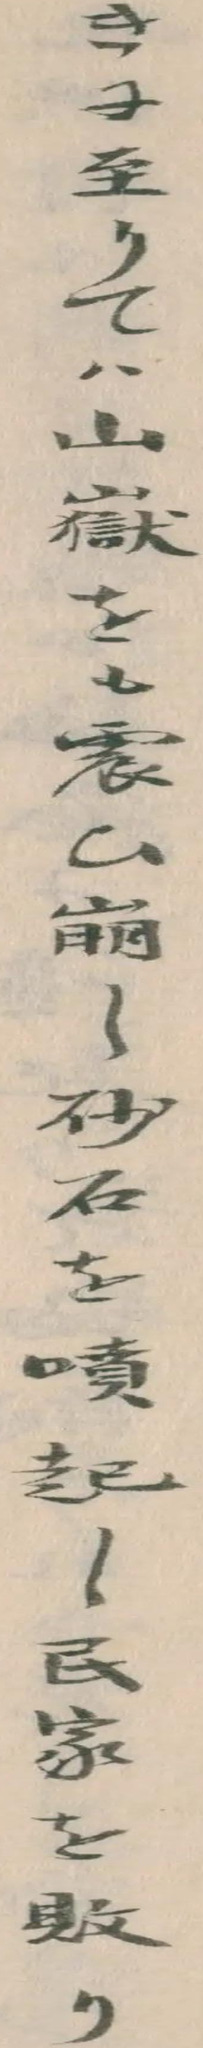きに至りては山岳をも震ひ崩し砂石を噴起し民家を敗り
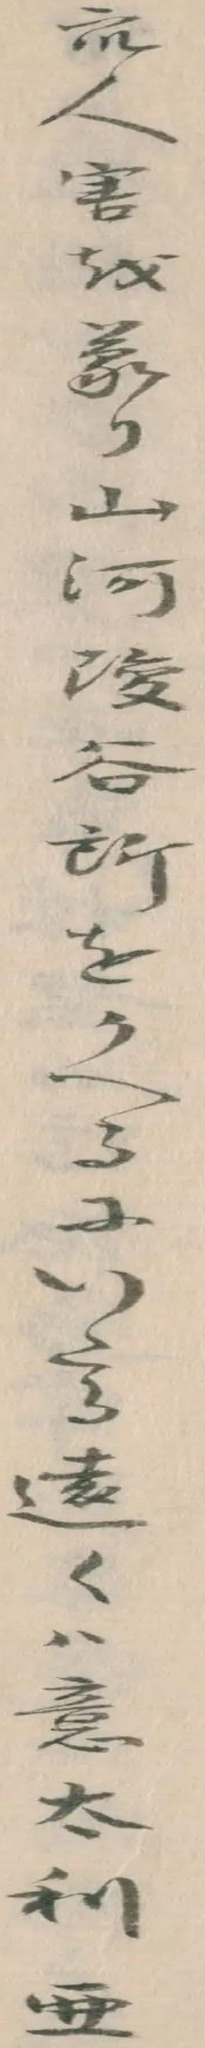衆人害を蒙り山河凌谷所をかへるにいたる遠くは意太利亜
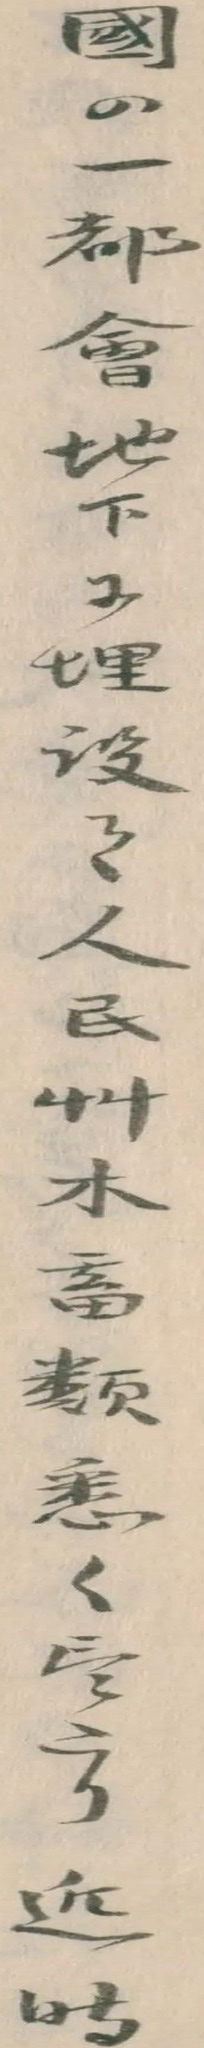国の一都会地下に埋没て人民草木畜類悉く尽たり近時
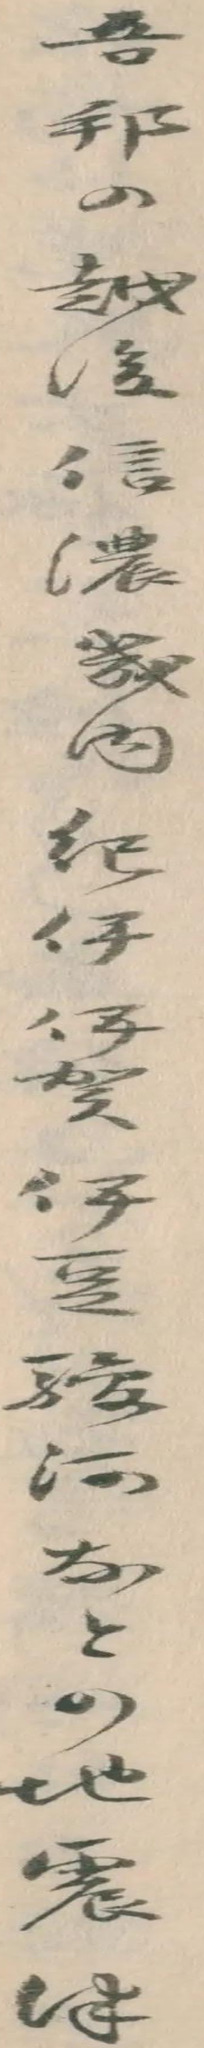吾邦の越後信濃畿内紀伊伊賀伊豆駿河なとの地震津

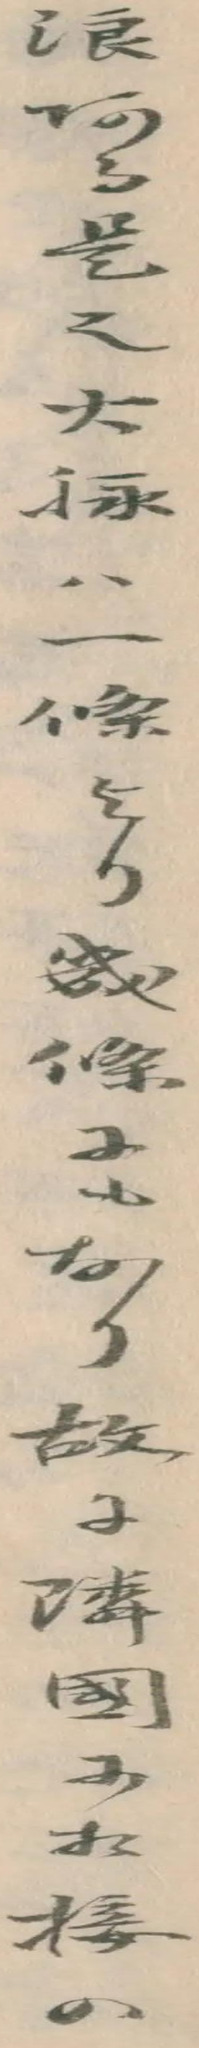浪ある是也火脈は一條より幾條にもなり故に隣国に相接の
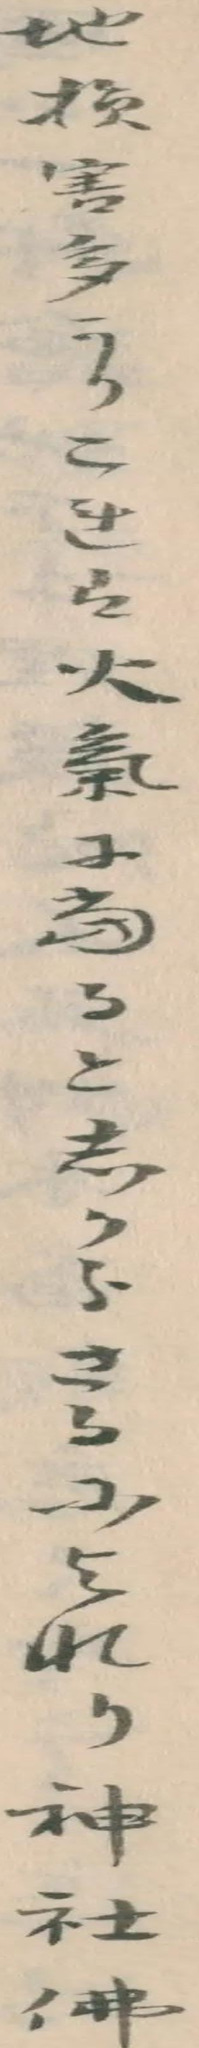地損害多かりこれは火気に当るとはからさるによれり神社仏
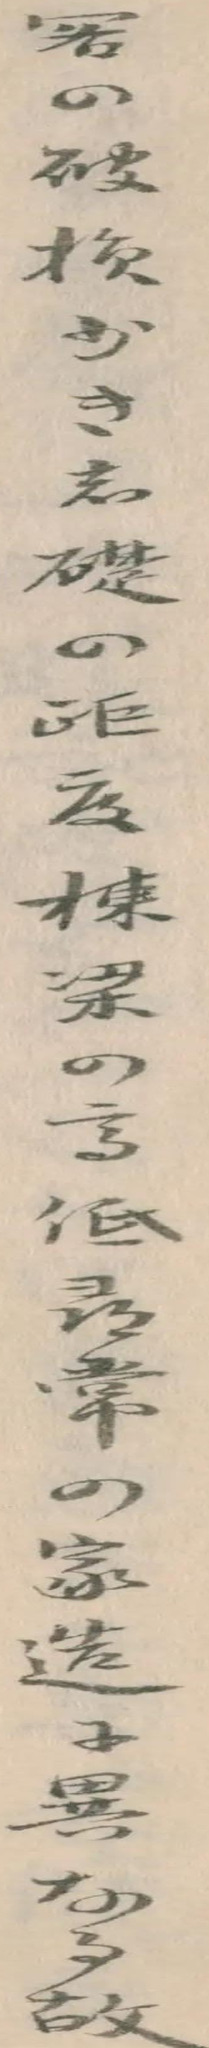閣の破損少きは礎の距度棟梁の高低尋常の家造に異なる故
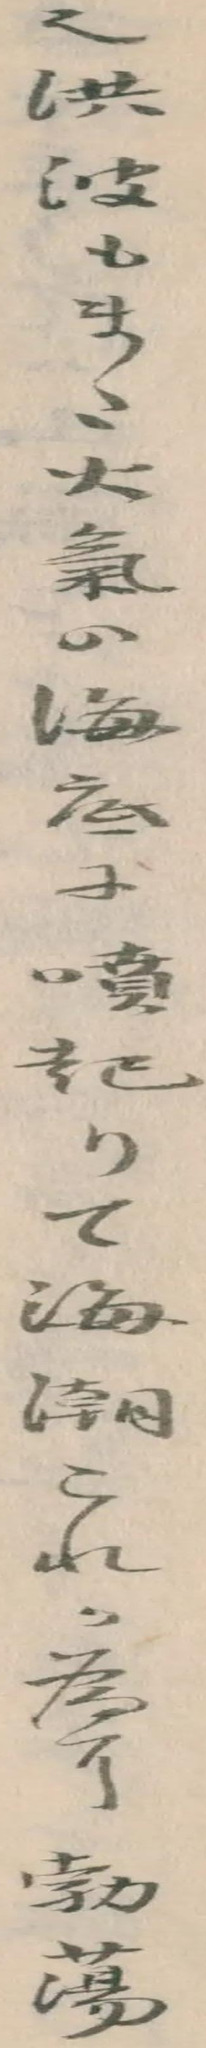也洪波もまた火気の海底に噴起りて海潮これか為に勃蕩
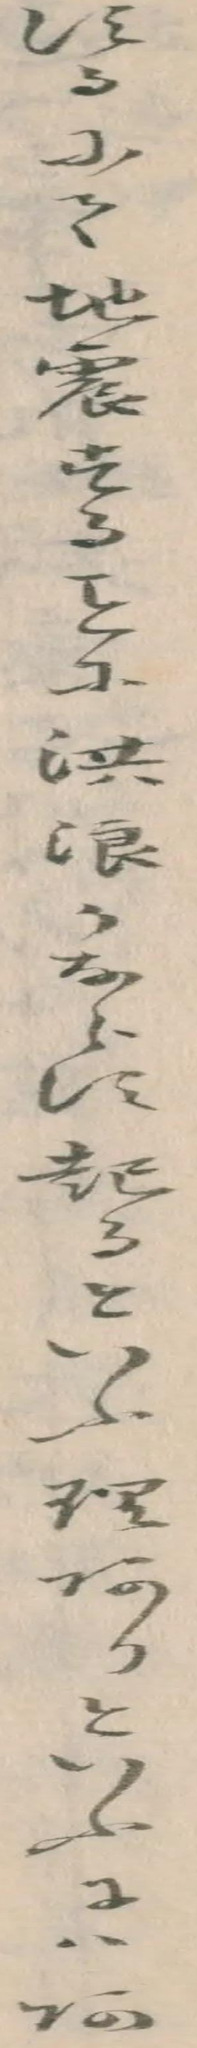するにて地震することに洪浪かならす起るといふ理ありといふにはあ
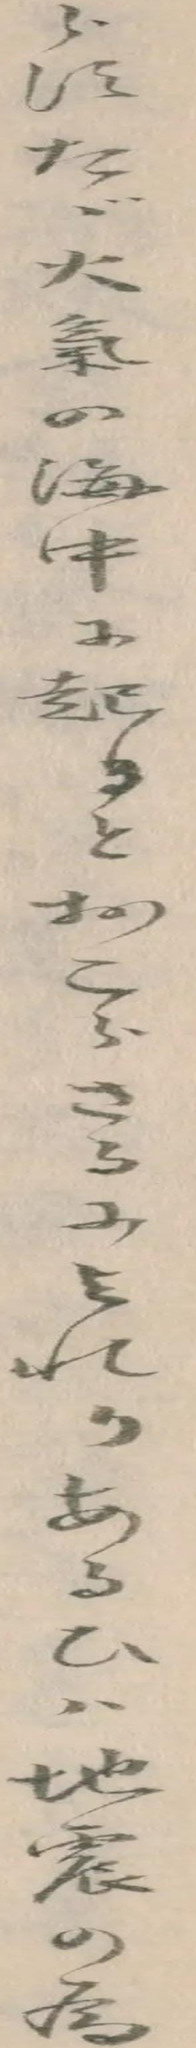らすたゞ火気の海中に起るとおこらさるによれりあるひは地震の為
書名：地災撮要. 巻10(地震之部) 上,下
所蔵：国立国会図書館 National Diet Library, JAPAN
